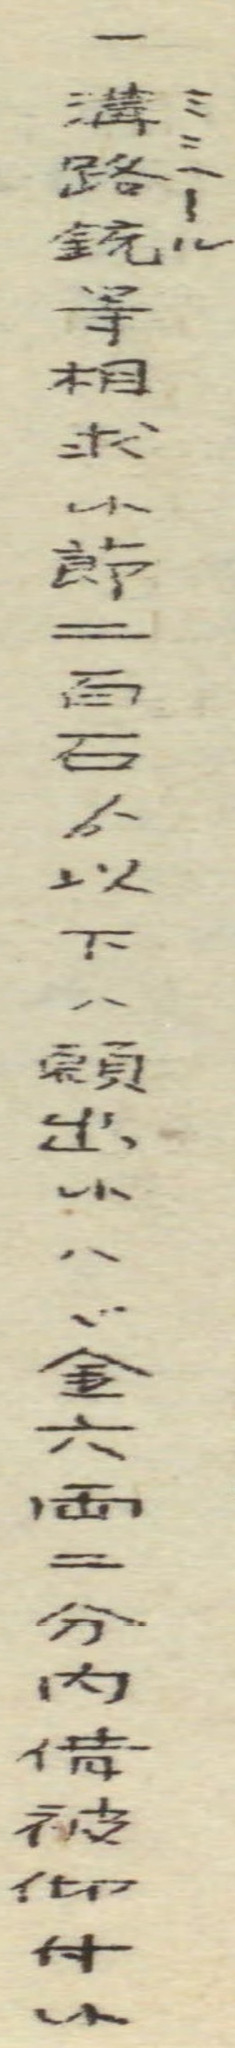一溝路銃等相求候節二百石ゟ以下ハ願出候ハゞ金六両二分内借被仰付候
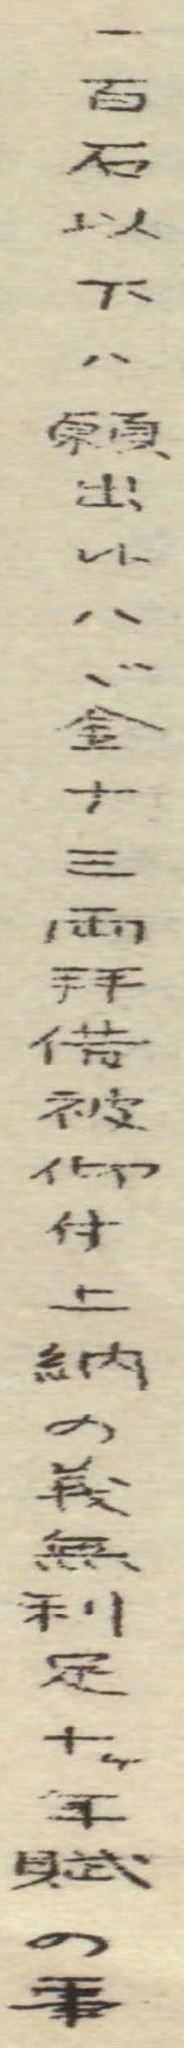一百石以下ハ願出候ハゞ金十三両拝借被仰付上納の義無利足十ヶ年賦の事
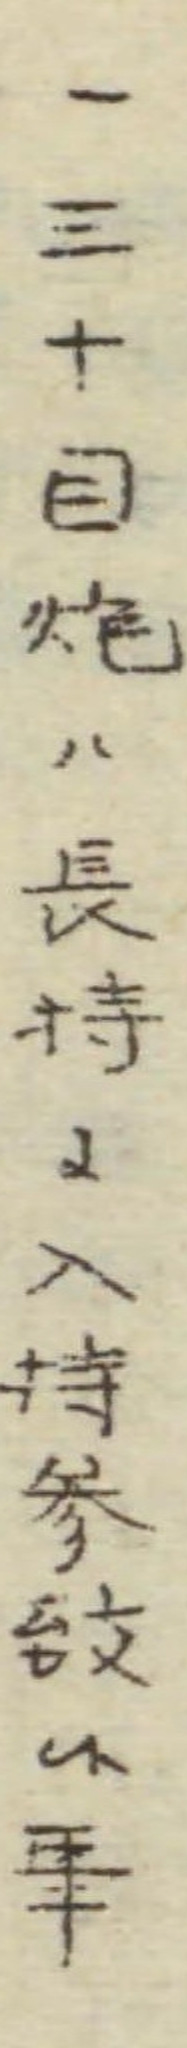一三十目炮は長持に入持参致候事

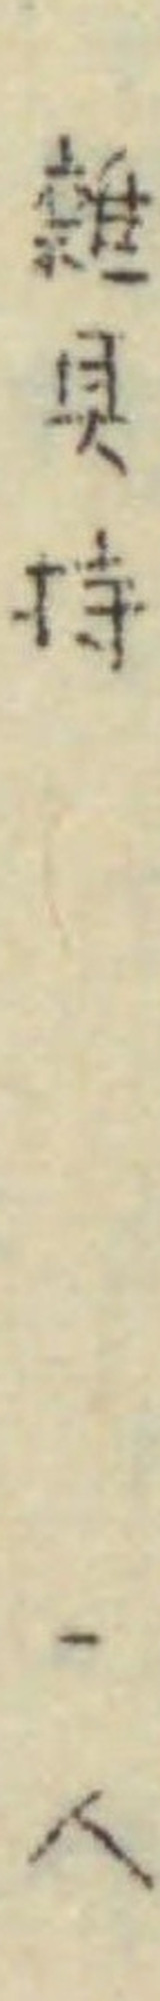雑具持一人
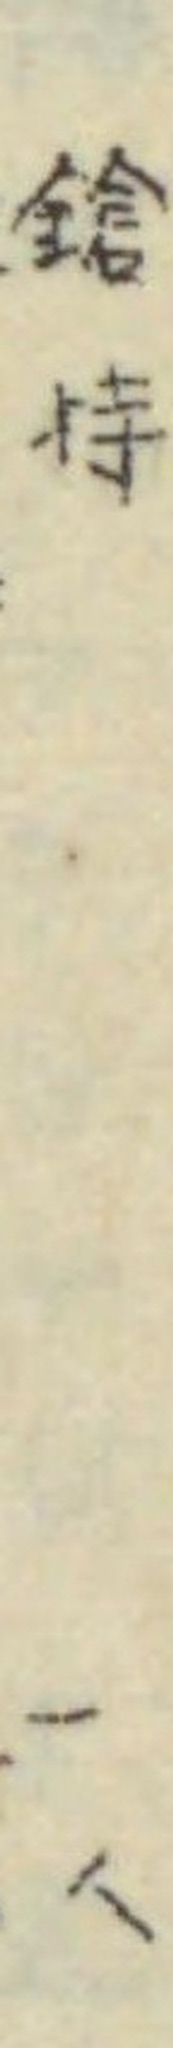槍持一人
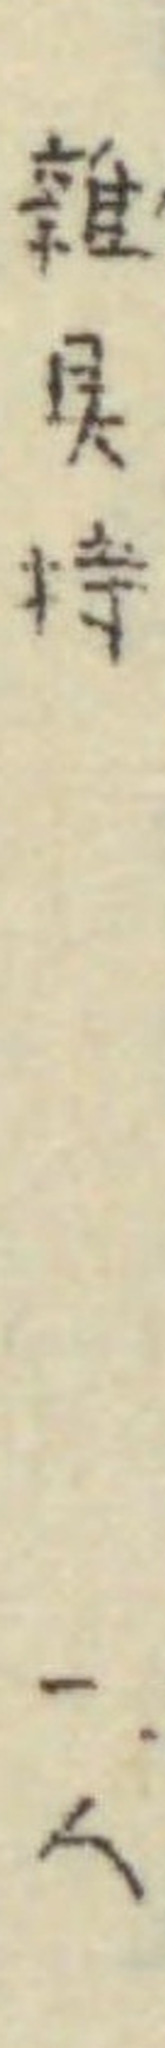雑具持一人
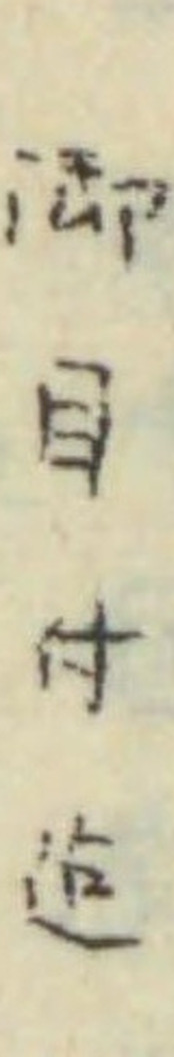一御目付同
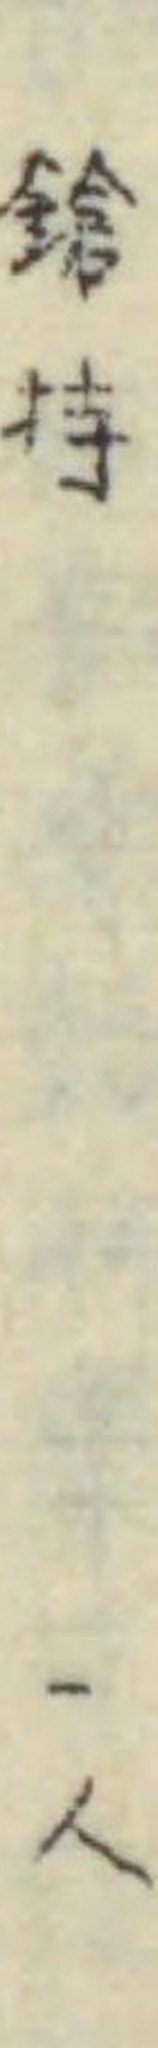槍持一人
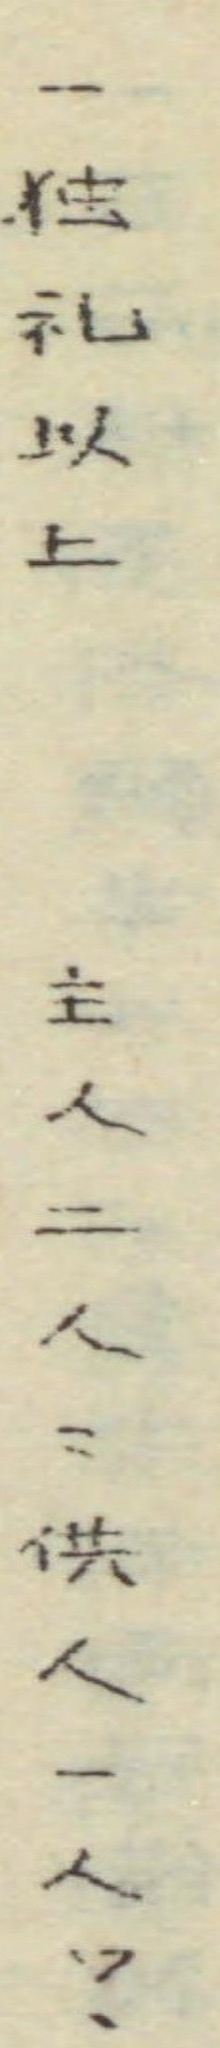一独礼以上主人二人二供人一人ツゝ
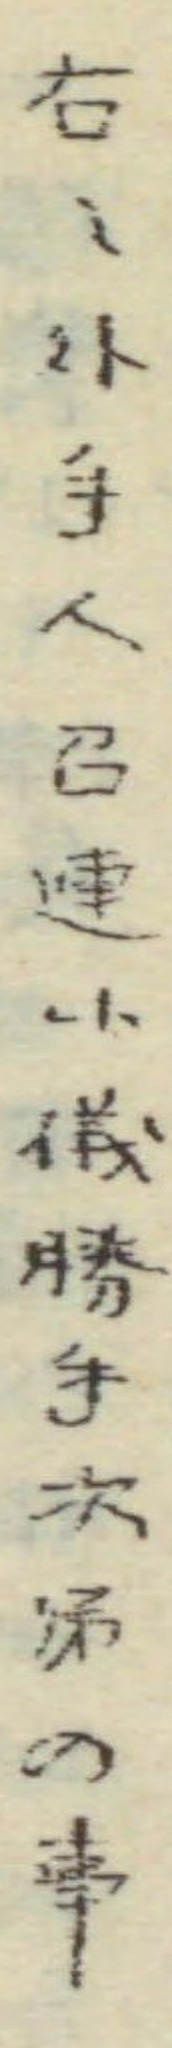右之外手人召連候儀勝手次第の事
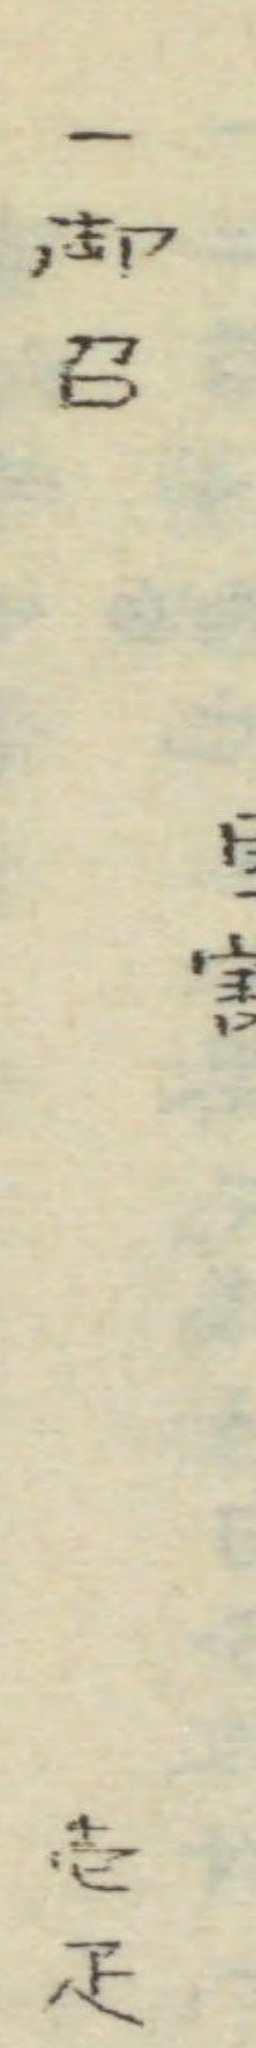一御召壱疋
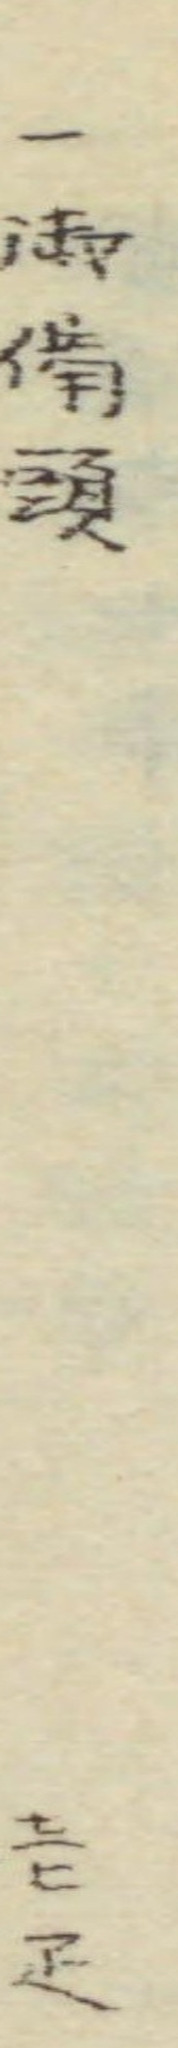一御備頭壱疋
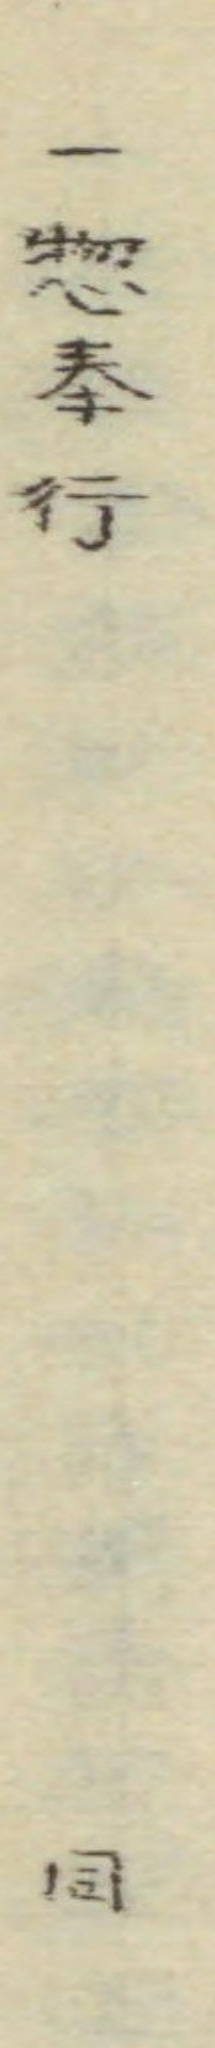一惣奉行同
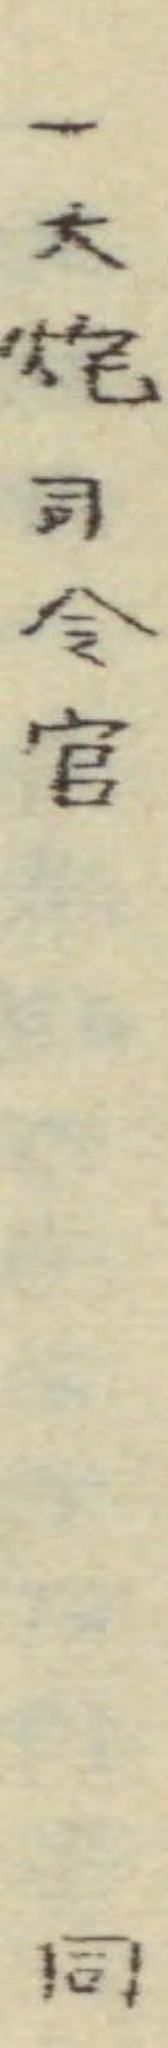一大炮司令官同
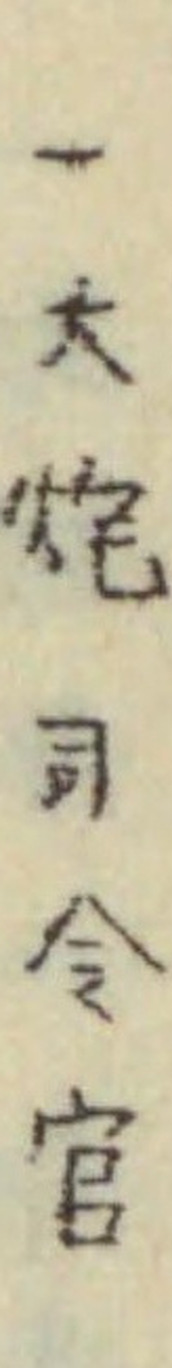一大炮司令官同
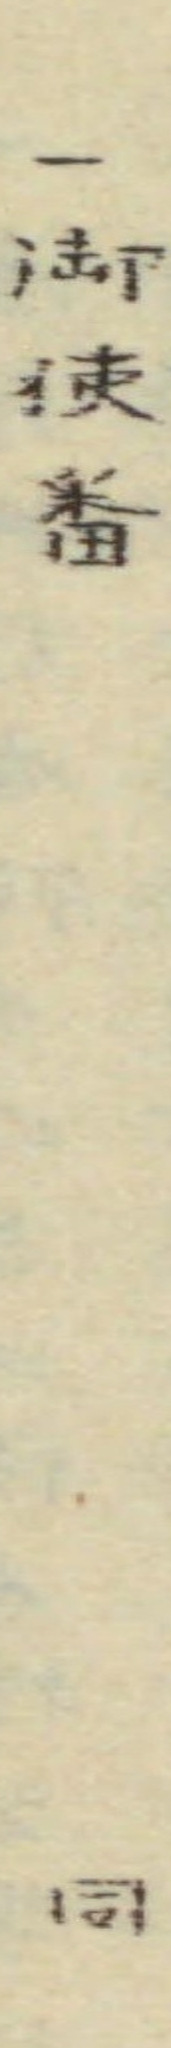一御使番同
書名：三河吉田藩動員史料
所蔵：国立国会図書館 National Diet Library, JAPAN
